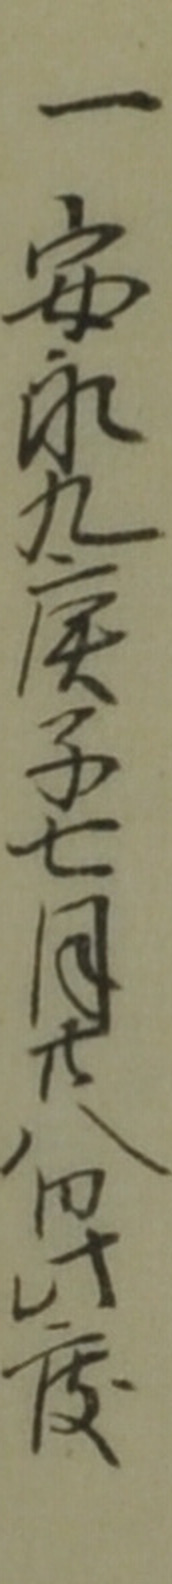一安永九庚子七月廿八日此度
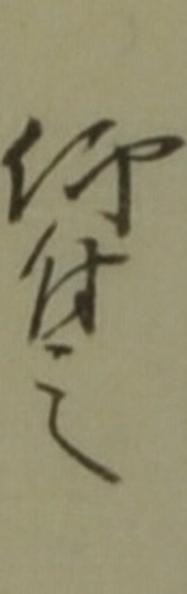仰付之
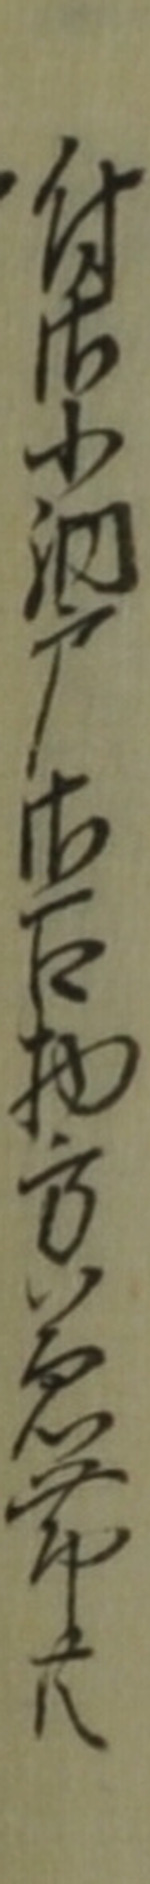付御小納戸御召物方兼帯共
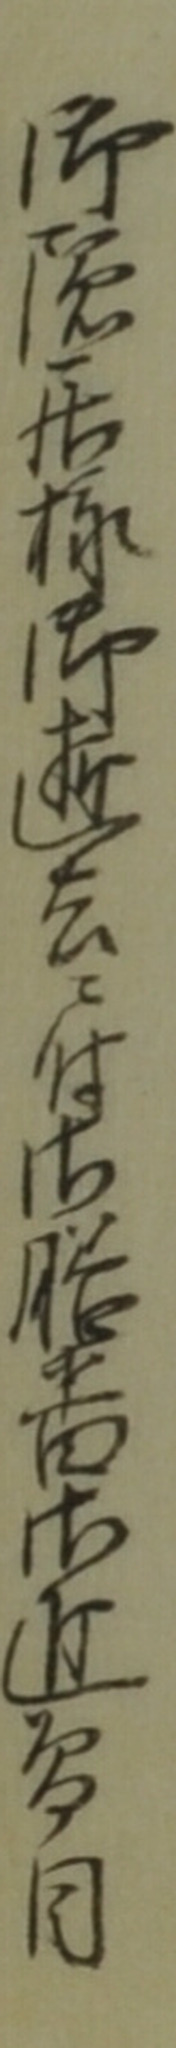御隠居様御逝去ニ付御膳番御近習目
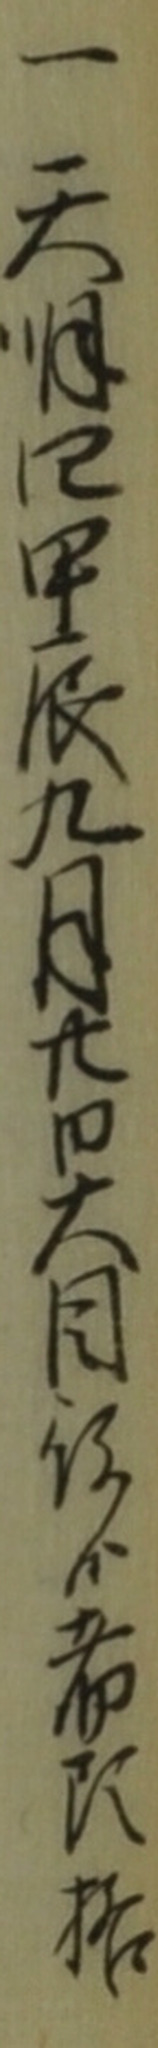一天明四甲辰九月廿日大目付役ゟ者頭格
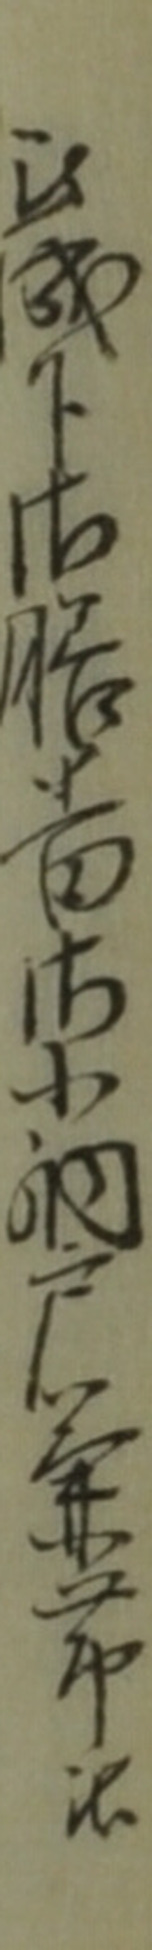被成下御膳番御小納戸兼帯被
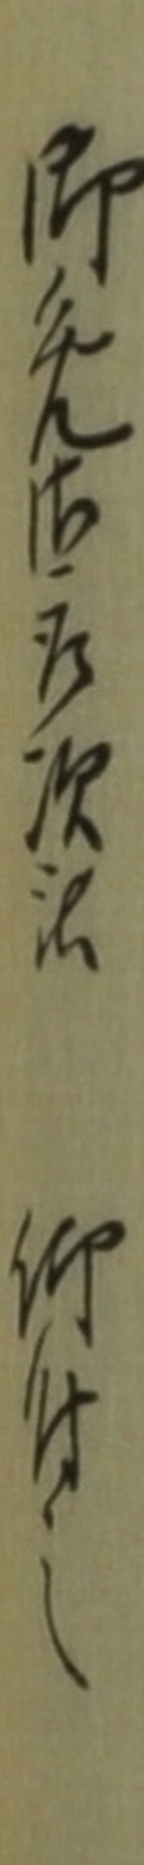御免御取次被仰付之
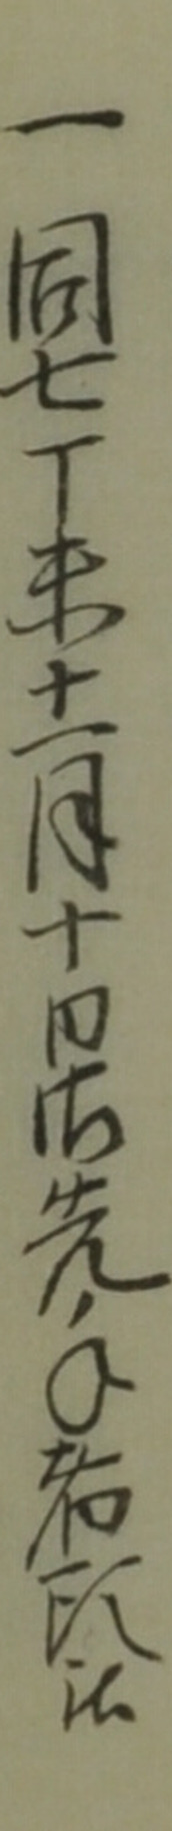一同七丁未十一月十日御先手者頭被
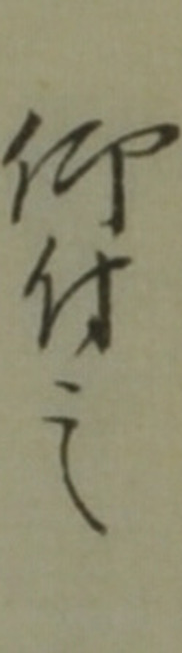仰付之
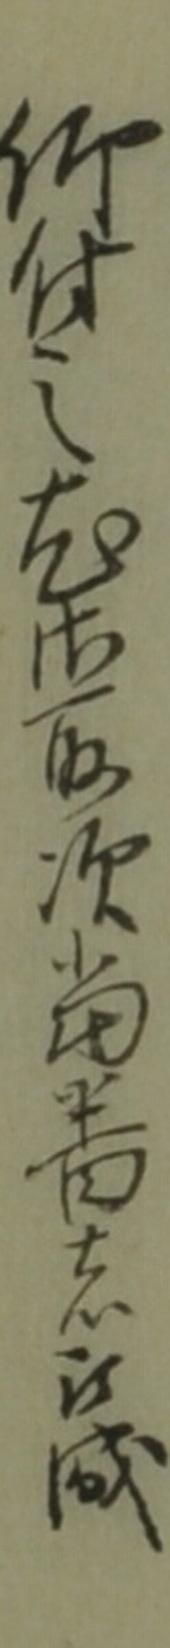仰付之尤御取次当番者被成
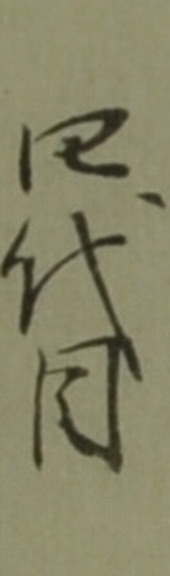四代目
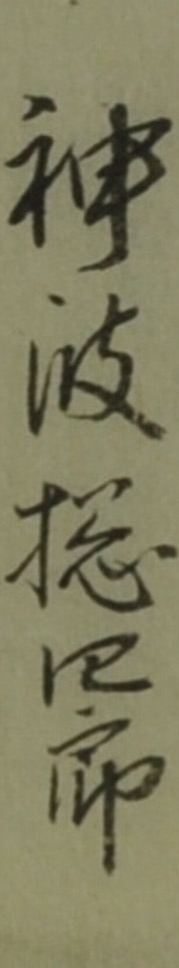神波捴四郎
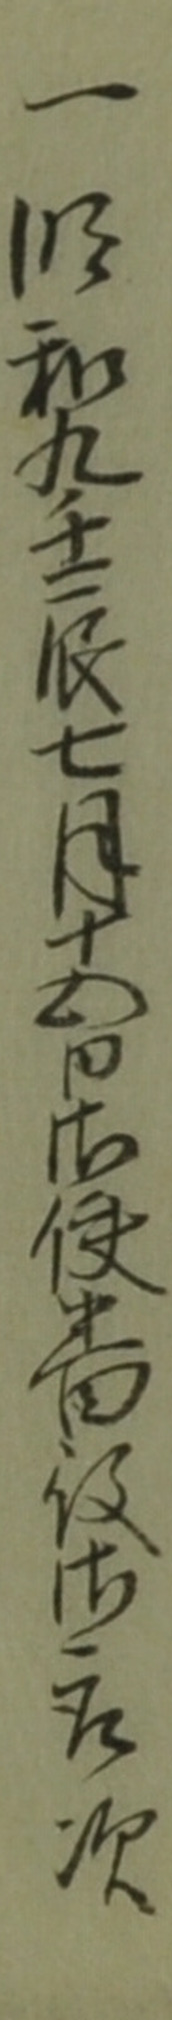一明和九壬辰七月十五日御使番役御取次
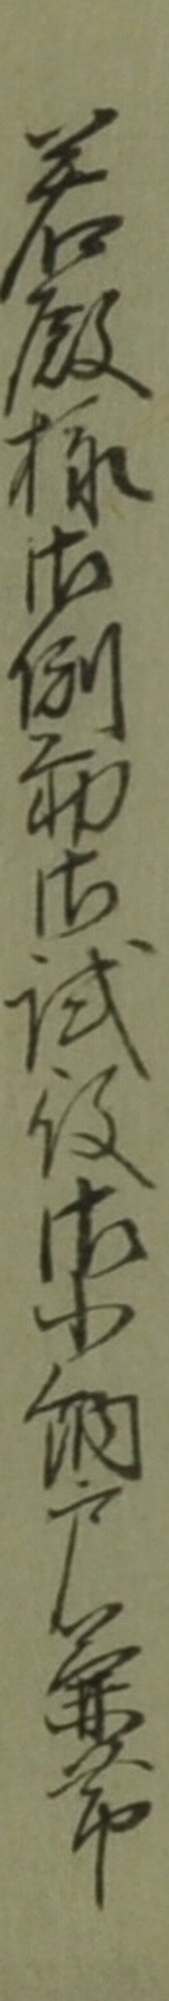若殿様御側勤御試役御小納戸兼帯
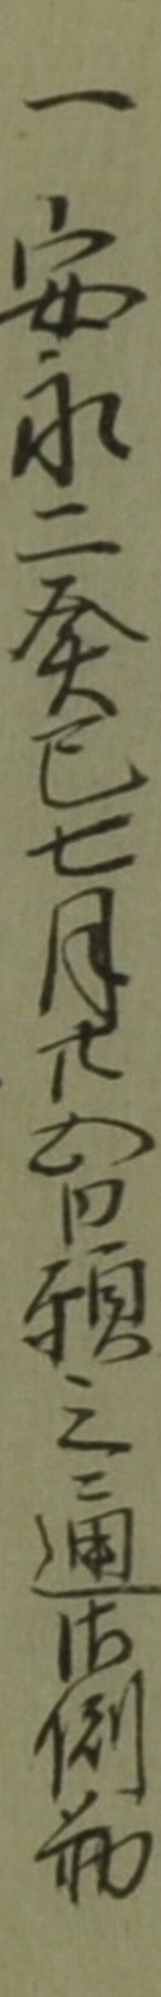一安永二癸巳七月廿五日願之通御側
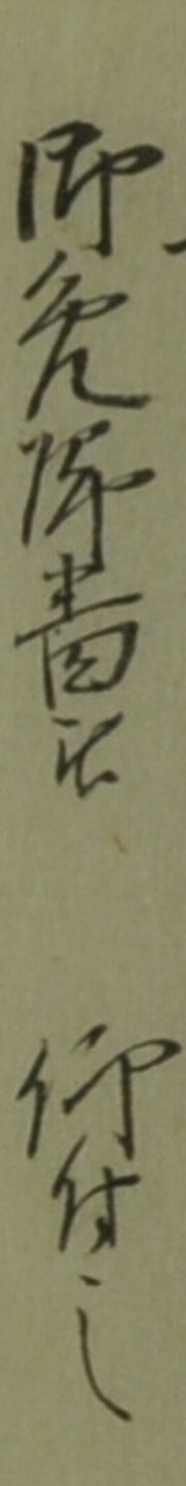御免帰番仰付之
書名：諸御役代々録（四）
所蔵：伊那市立高遠町図書館・合同会社AMANE
